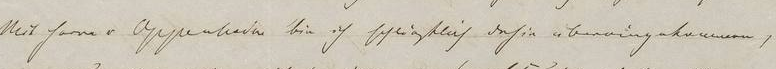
Mit Herrn v Oppenheim bin ich schließlich dahin übereingekommen,
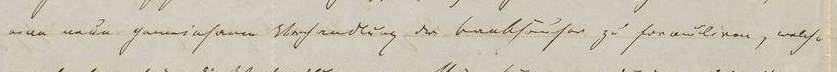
eine neue gemeinsame Verhandlung der Bankhäuser zu formuliren, welche
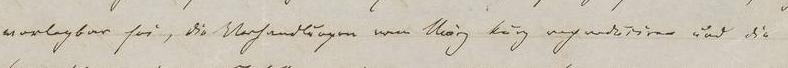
vorlegbar sei, die Verhandlungen von März kurz reproduciren und die
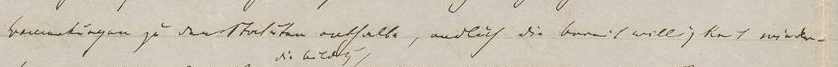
Bemerkungen zu den Statuten enthalte, endlich die Bereitwilligkeit wieder-
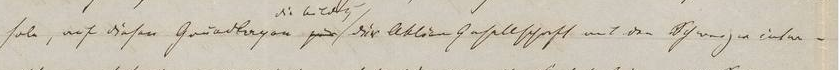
hole, auf diesen Grundlagen zurdie Bildung der Aktien Gesellschaft mit den Schweizer inter-
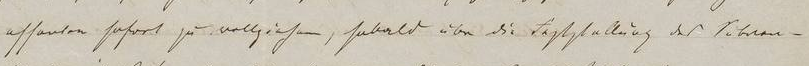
essenten sofort zu vollziehen, sobald über die Feststellung des Subven-
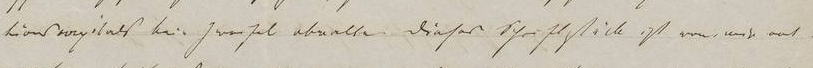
tionscapitals kein Zweifel obwalte. Dieses Schriftstück ist von mir ent-
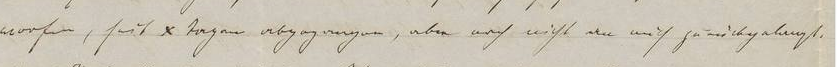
worfen, seit x Tagen abgegangen, aber noch nicht an mich zurückgelangt.
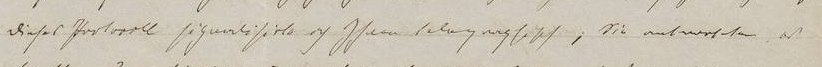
Dieses Protocoll signalisirte ich Ihnen telegraphisch, Sie antworteten, es
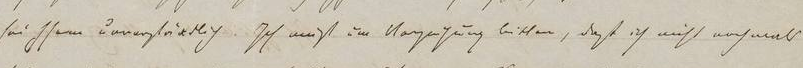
sei Ihnen unverständlich. Ich muß um Verzeihung bitten, daß ich nicht nochmals
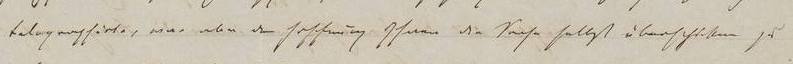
telegraphirte, war aber der Hoffnung Ihnen die Sache selbst überschicken zu
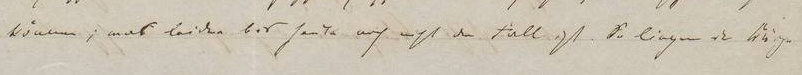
können; was leider bis heute noch nicht der Fall ist. So liegen in Kürze
